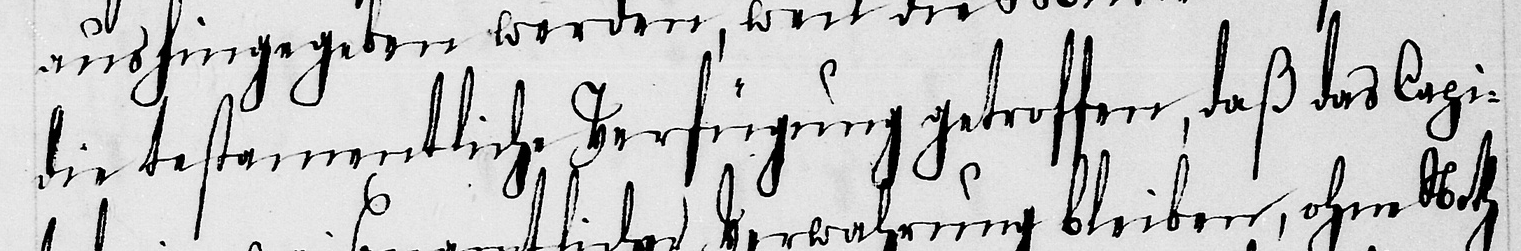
die testamentliche Verfügung getroffen, daß das Cap¬
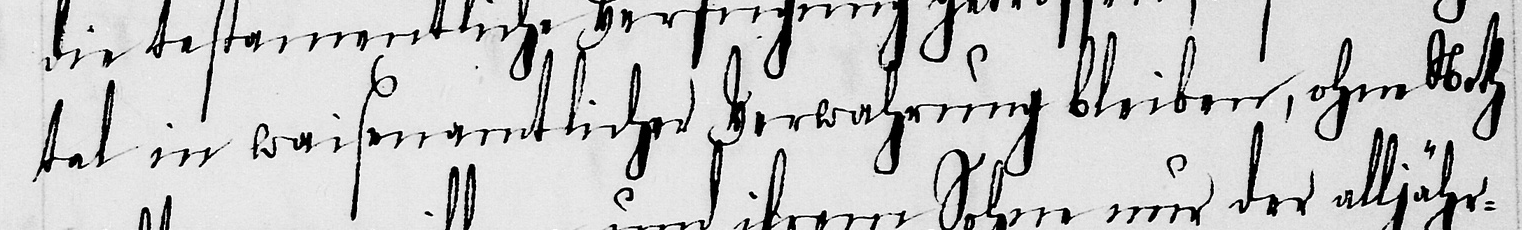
ital in waisenamtlicher Verwahrung bleiben, ohne Noth
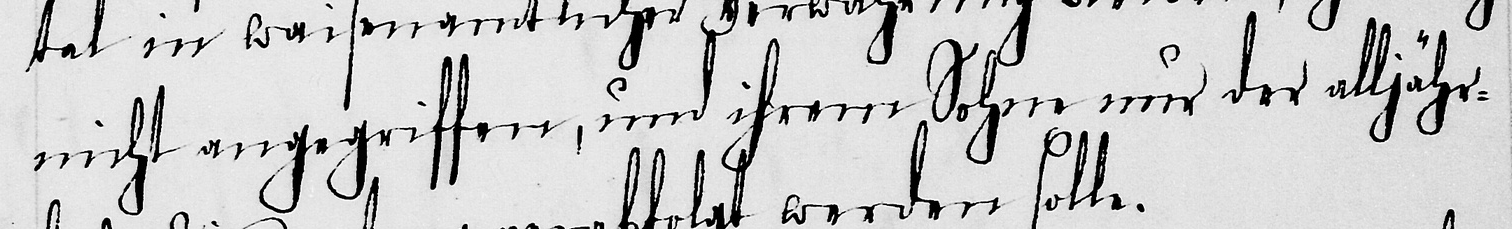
nicht angegriffen, und ihrem Sohne nur der alljähr¬
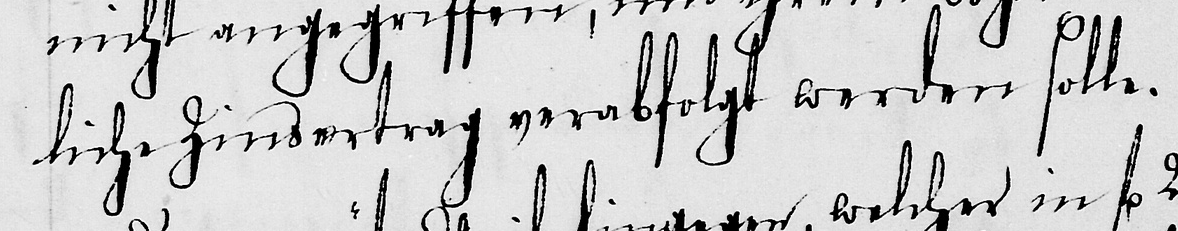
liche Zinsertrag verabfolgt werden solle.
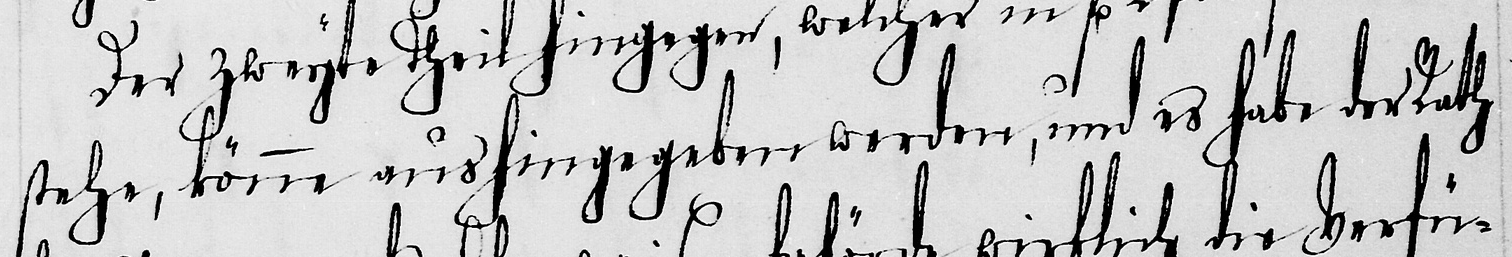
stehe, könne aushingegeben werden, und es habe der Rath
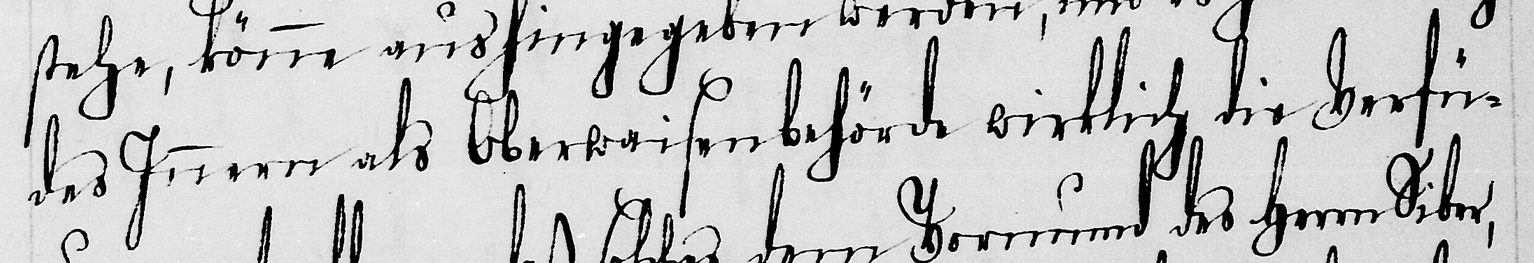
des Innern als Oberwaisenbehörde wirklich die Verfü¬
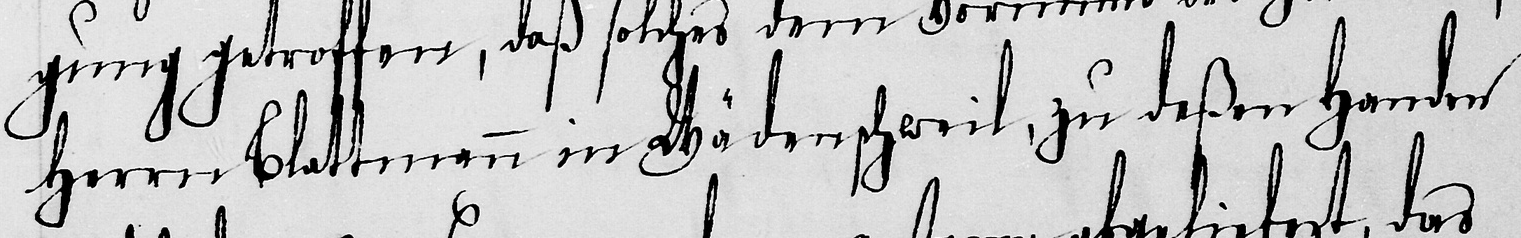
Herrn Blattmann in Wädenschweil, zu deßen Handen
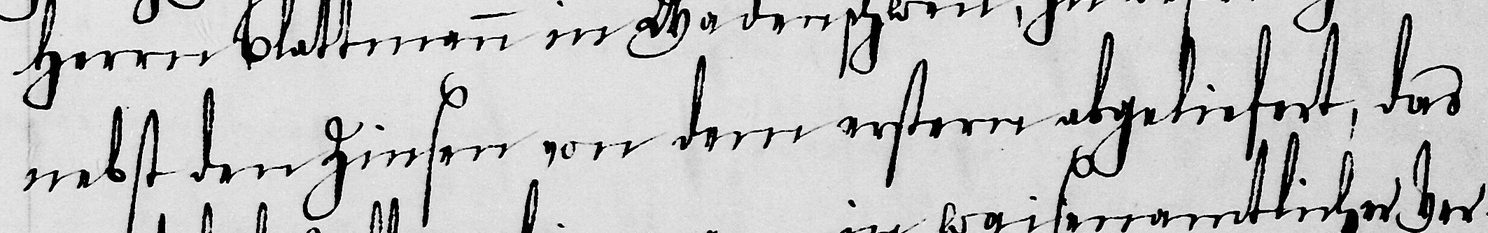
nebst den Zinsen von dem erstern abgeliefert, das
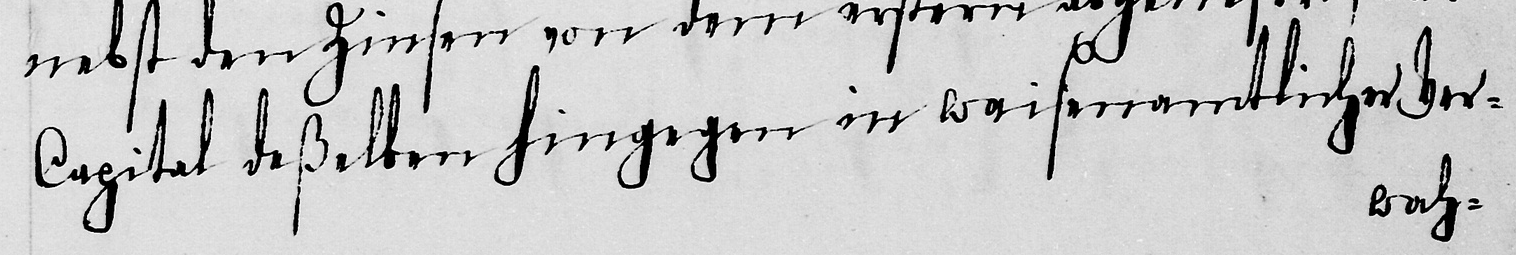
Capital deßelben hingegen in waisenamtlicher Ver-
